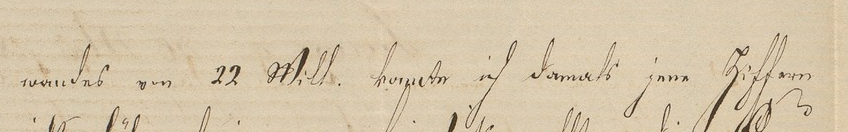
wandes von 22 Mill. konnte ich damals jene Ziffern
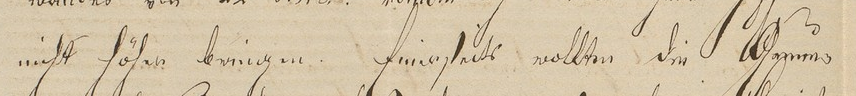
nicht höher bringen. Einerseits wollten die Genue-
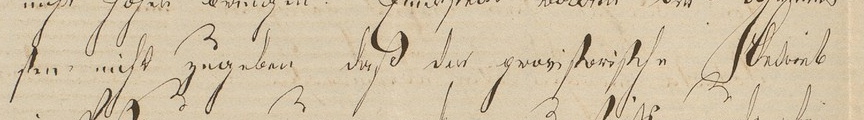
sen nicht zugeben daß der provisorische Betrieb
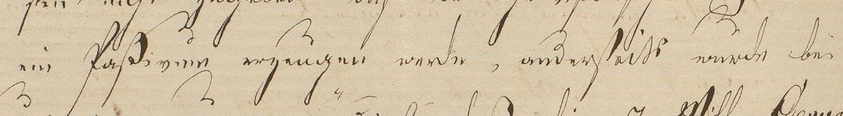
ein Passivum erzeugen werde, anderseits wurde bei
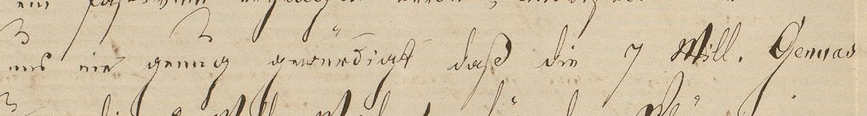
uns nie genug gewürdigt daß die 7 Mill. Genuas
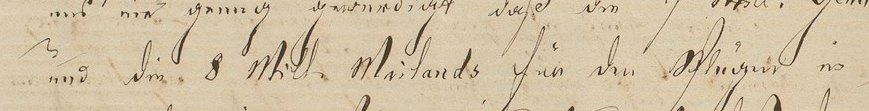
und die 8 Mill. Mailands für den Splügen in
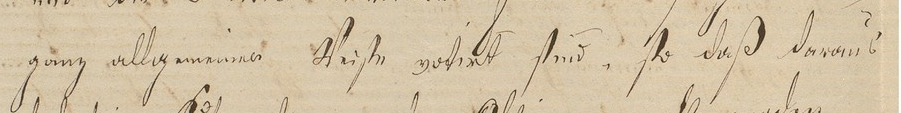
ganz allgemeiner Weise votirt sind, so daß daraus
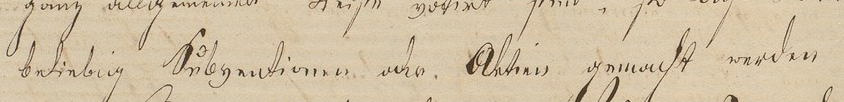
beliebig Subventionen oder Aktien gemacht werden
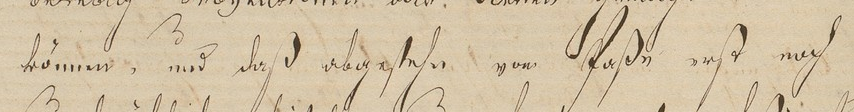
können, und daß abgesehen vom Paße erst noch
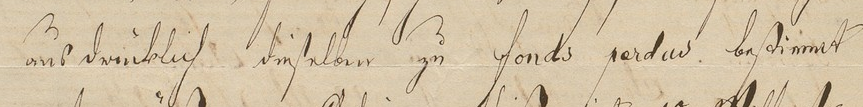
ausdrücklich dieselben zu fonds perdus bestimmt
